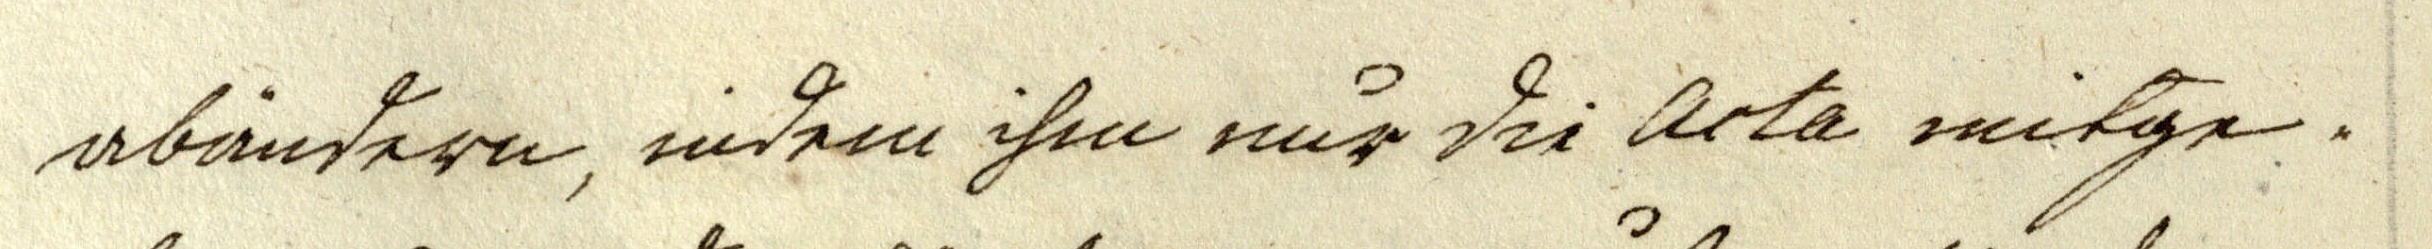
abändern, indem ihm nur die Acta mitge¬
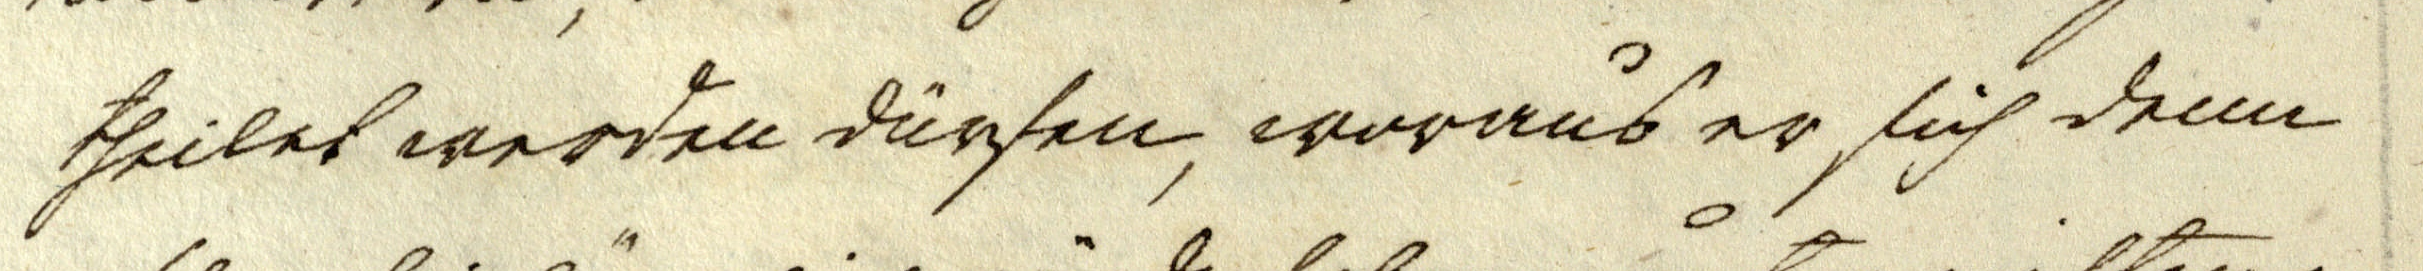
theilet werden dürfen, woraus er sich denn
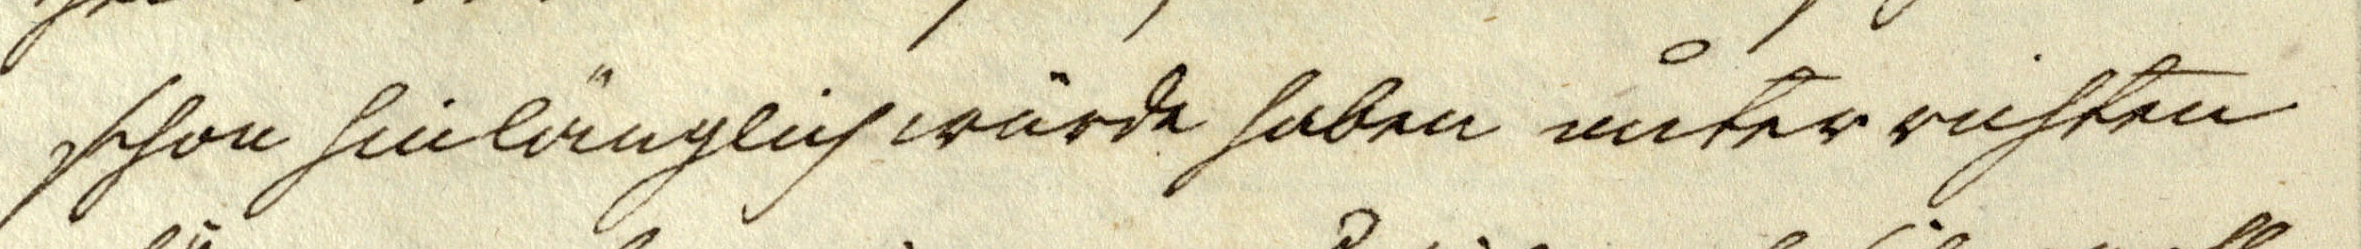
schon hinlänglich würde haben unterrichten
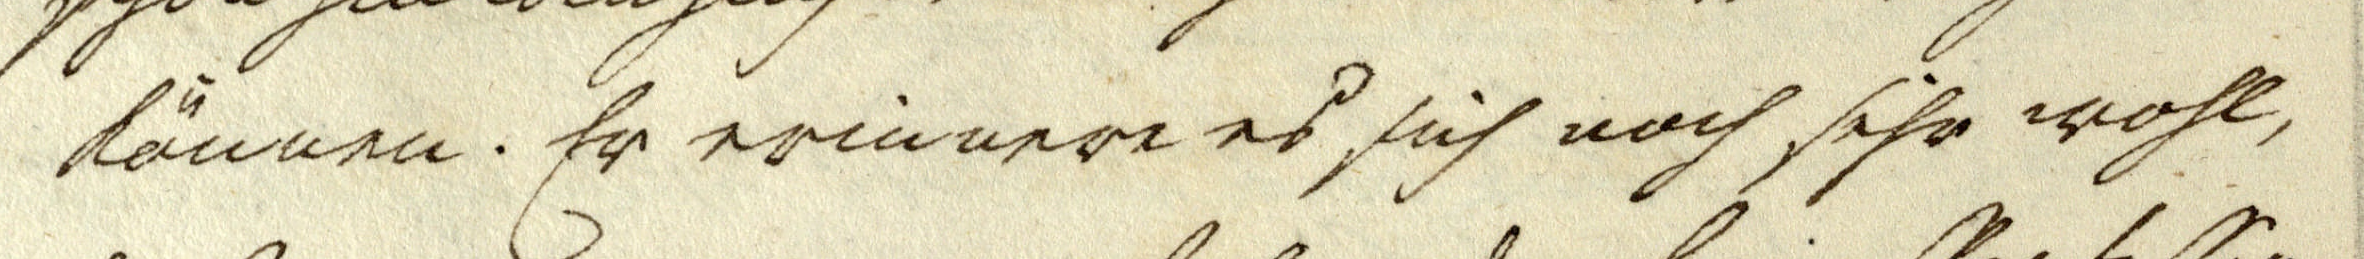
können. Er erinnere es sich noch sehr wohl,
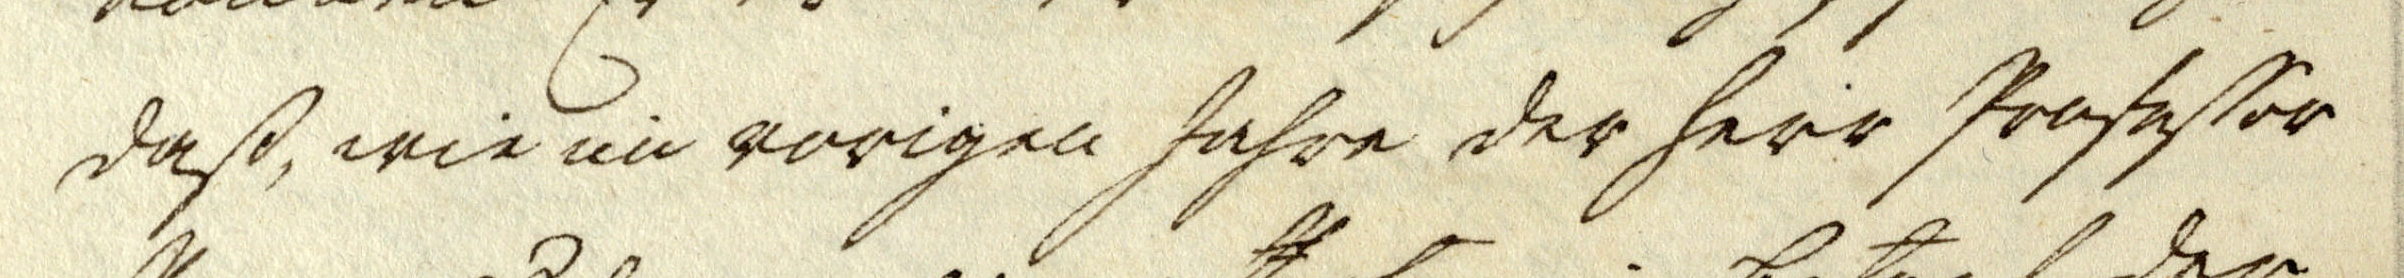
daß, wie im vorigen Jahre der Herr Professor
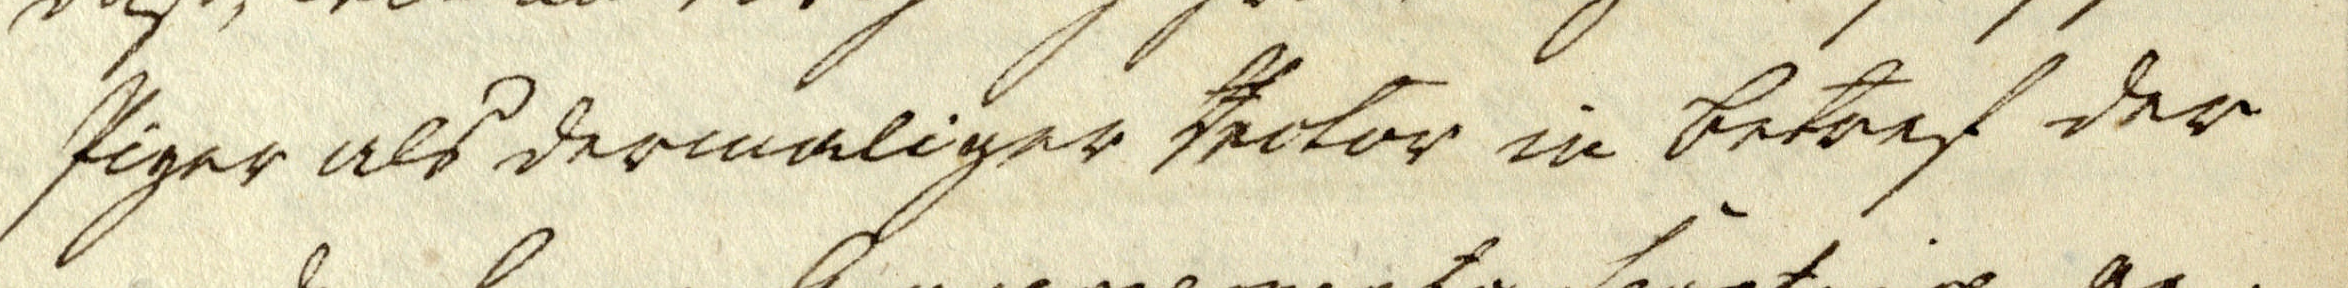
Piper als dermaliger Rector in Betref der
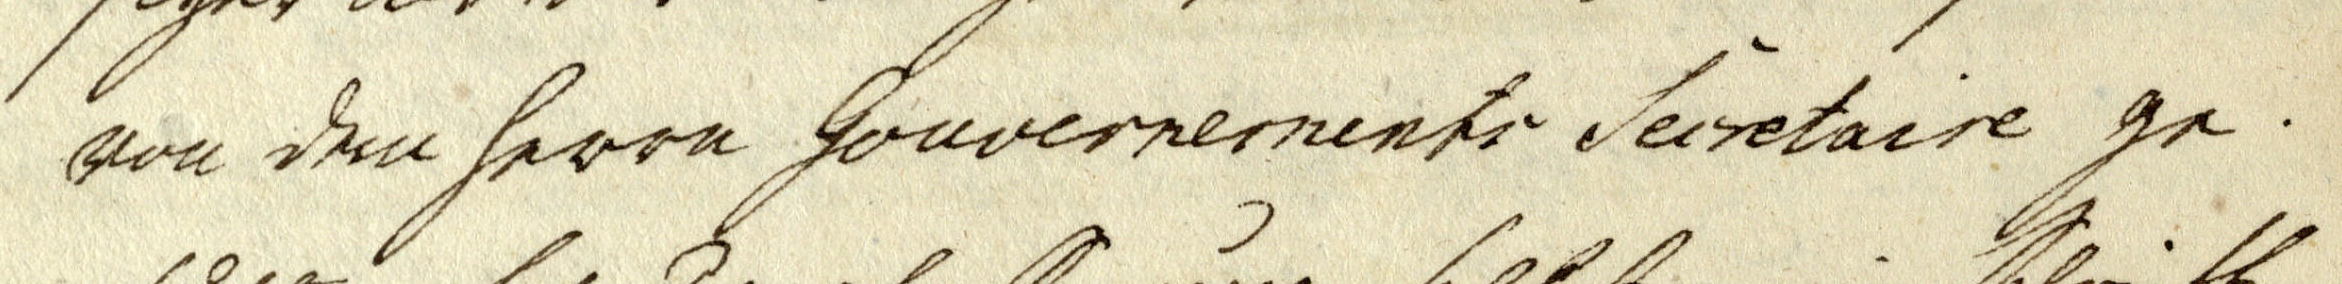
von dem Herrn Gouvernements Secretaire ge¬
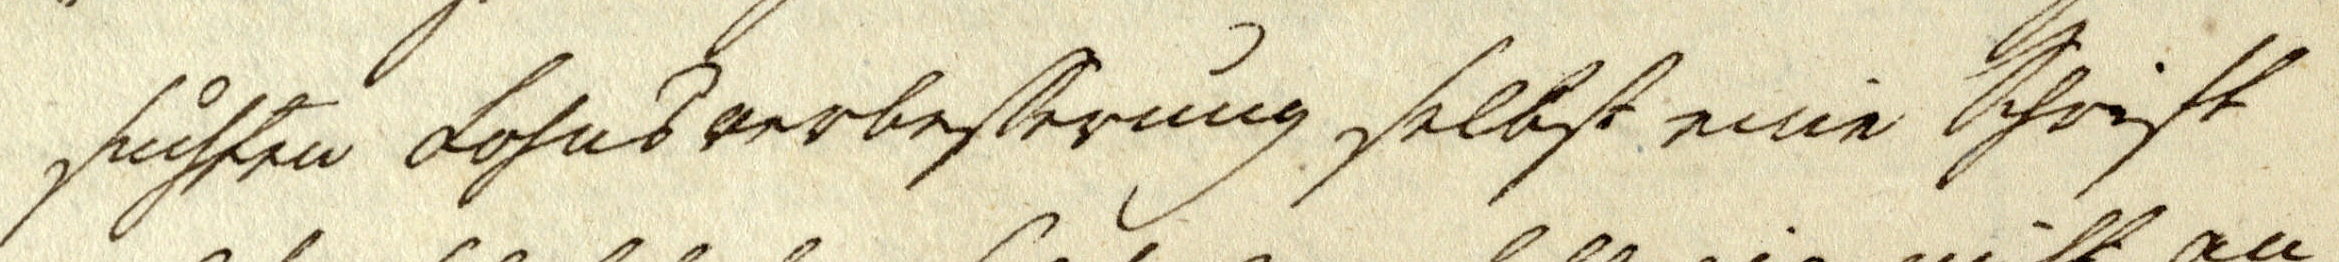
suchten Lohnsverbesserung selbst eine Schrift
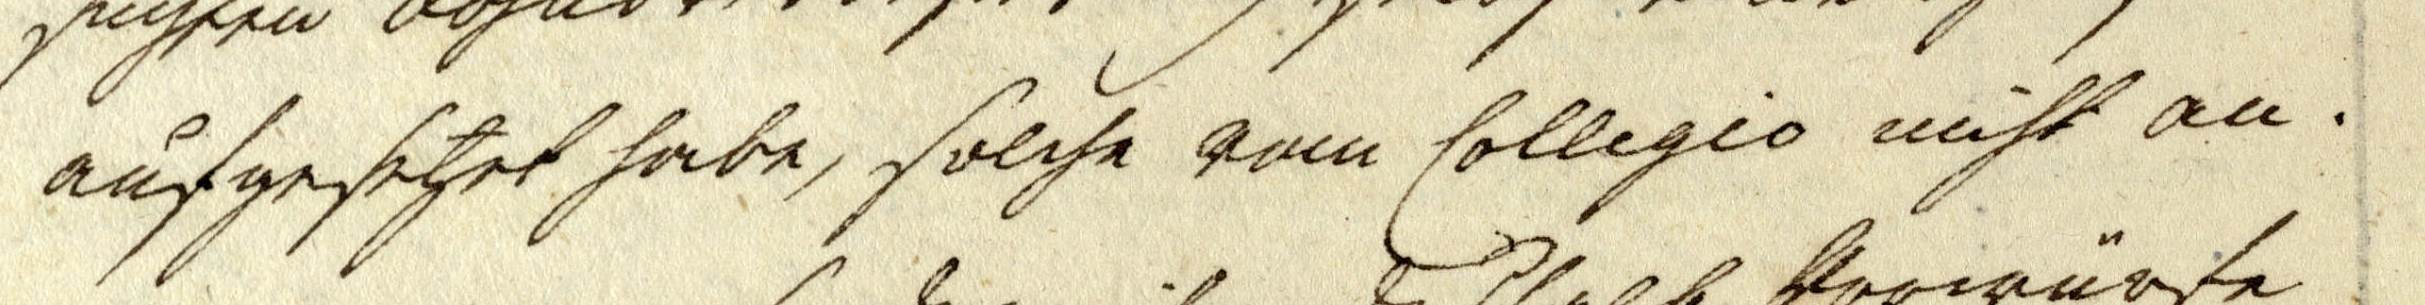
aufgesetzet habe, solche vom Collegio nicht an¬
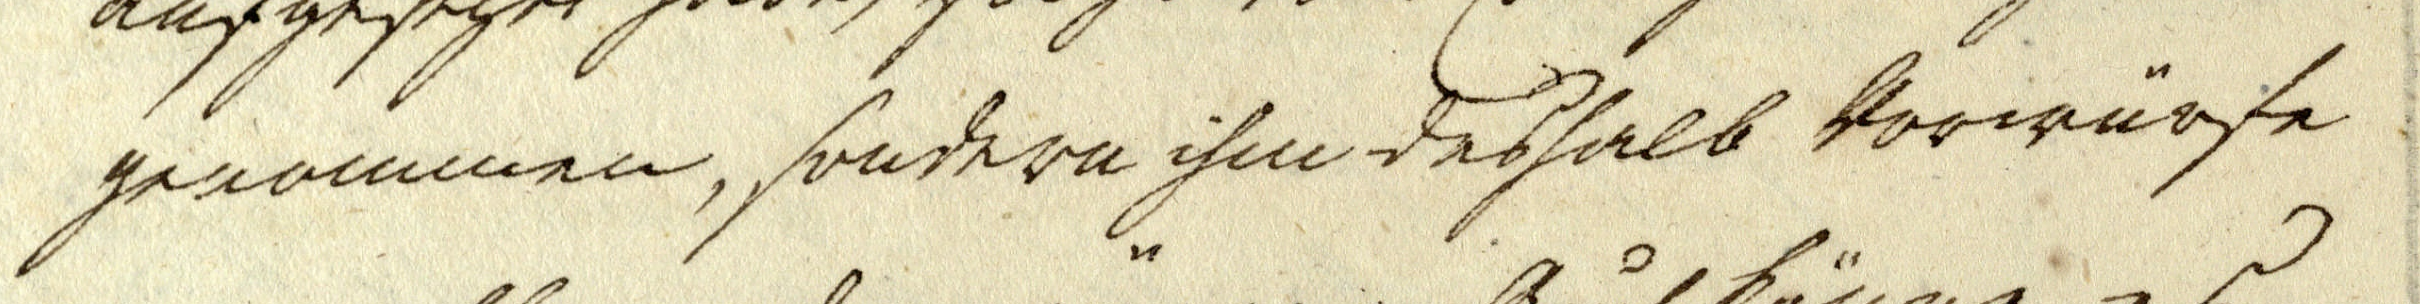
genommen, sondern ihm deshalb Vorwürfe
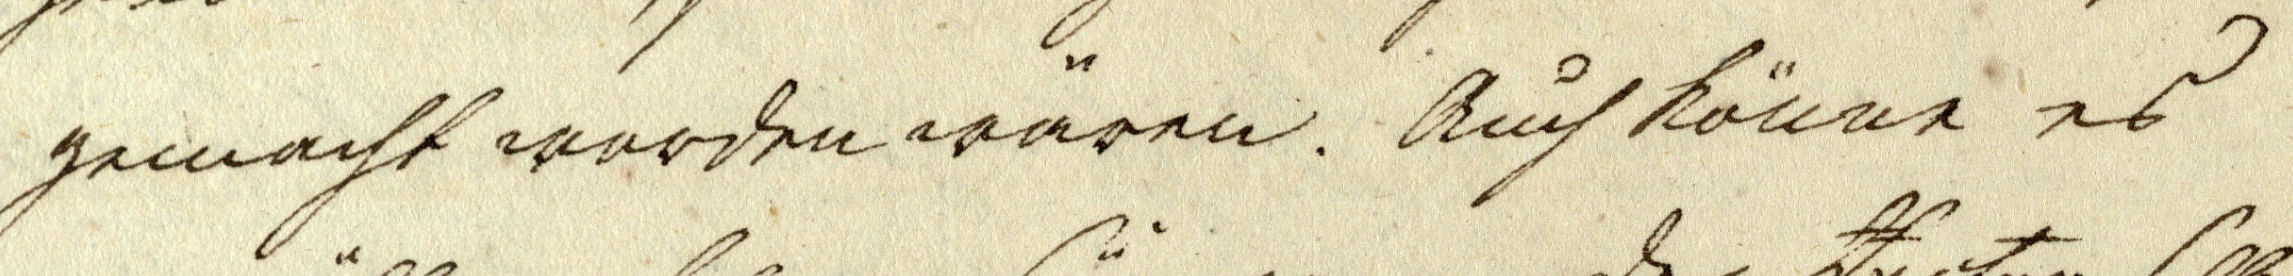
gemacht worden wären. Auch könne es
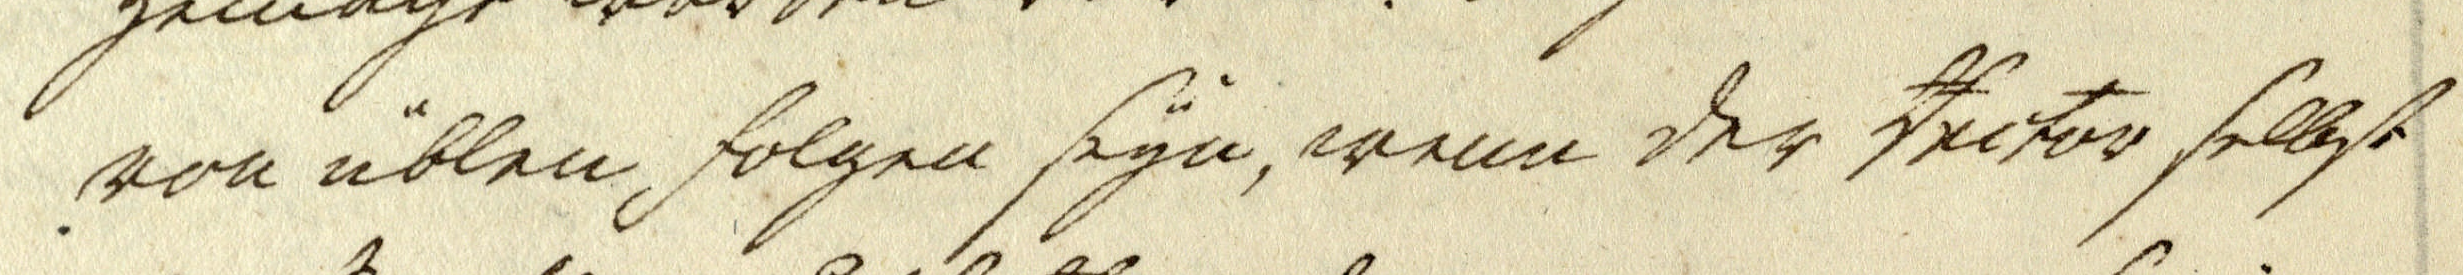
von üblen Folgen seÿn, wenn der Rector selbst
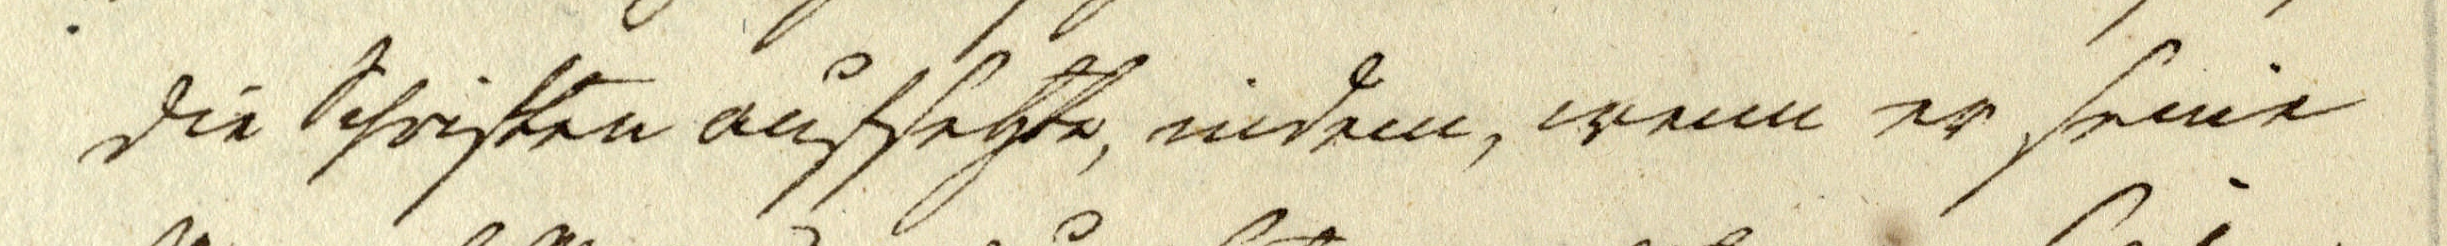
die Schriften aufsetzte, indem, wenn er seine
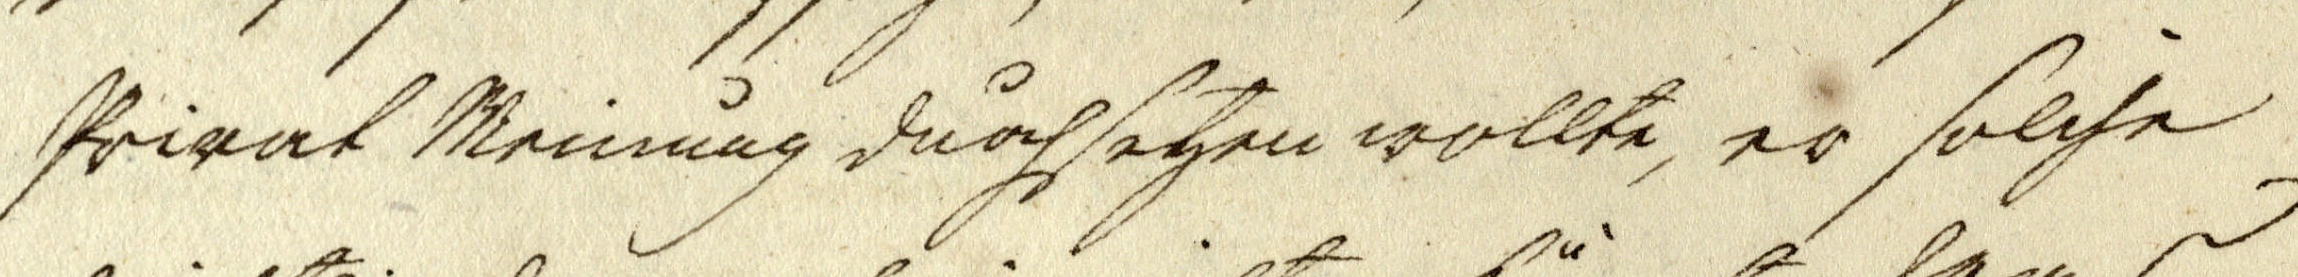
Privat Meinung durchsetzen wollte, er solche
